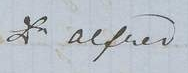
Dr Alfred
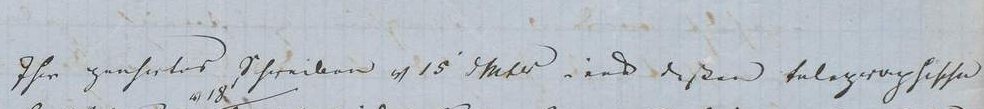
Ihr geehrtes Schreiben vom 15t dMts , und deßen telegraphische
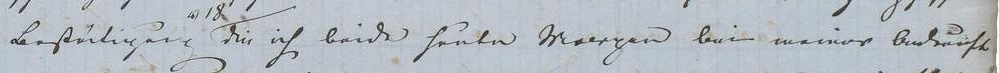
Bestätigung vom 18t die ich beide heute Morgen bei meiner Ankunft
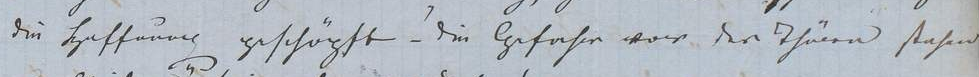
die Hoffnung geschöpft – die Gefahr vor der Thüre stehen
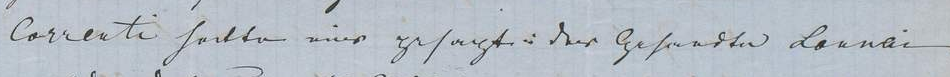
Correnti hatte mir gesagt: der Gesandte Lonnai
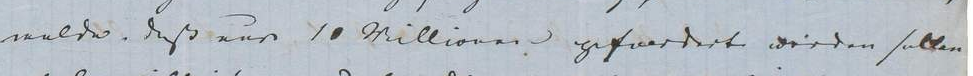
melde – daß nur 10 Millionen gefordert werden sollen
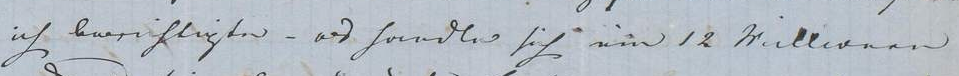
ich berichtigte – es handle sich um 12 Millionen
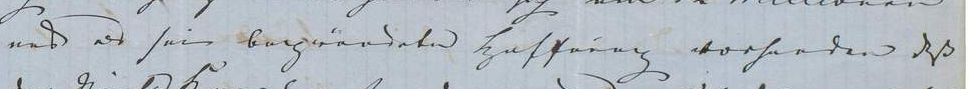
und es sei begründete Hoffnung vorhanden daß
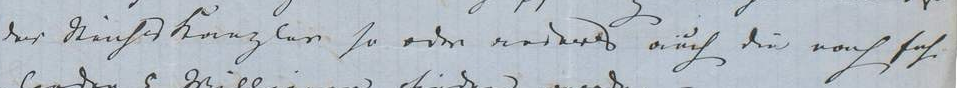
der Reichs Kanzler so oder anders auch die noch feh-
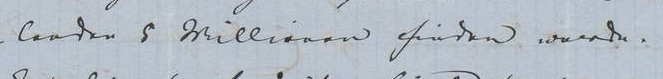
lenden 8 Millionen finden werde. –
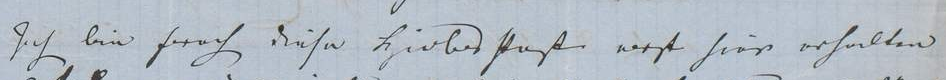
Ich bin froh diese Hiobs Post erst hier erhalten
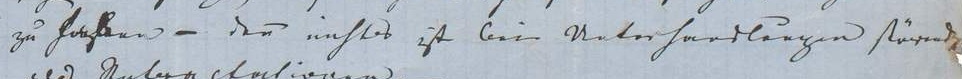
zu haben – denn nichts ist bei Unterhandlungen störender
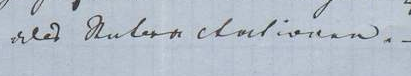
als Retractationen. –
